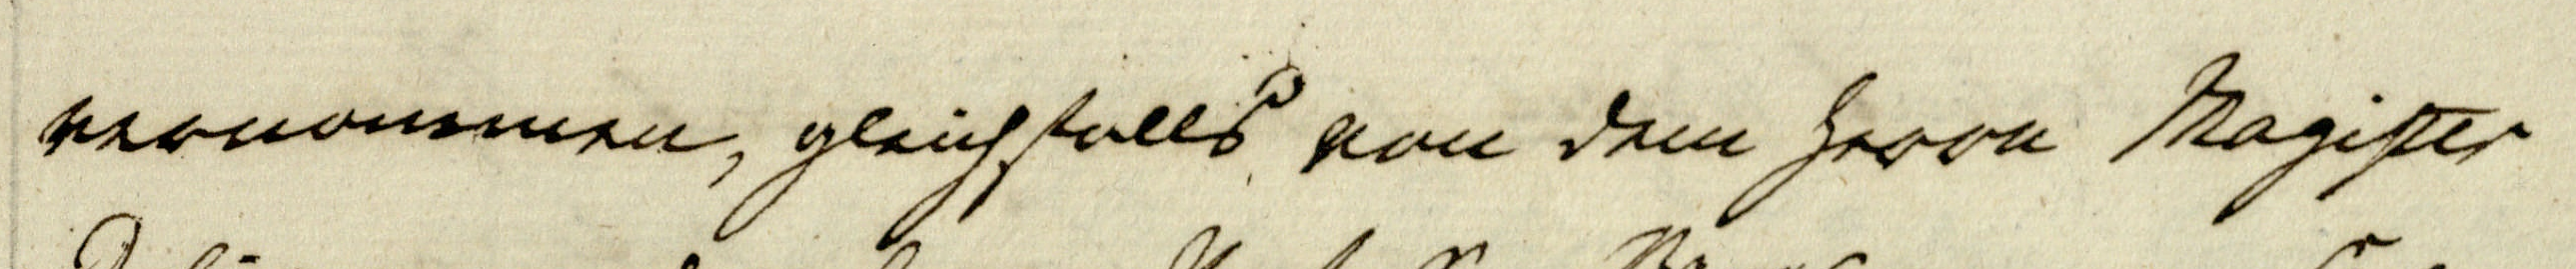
vernommen, gleichfalls von dem Herrn Magister
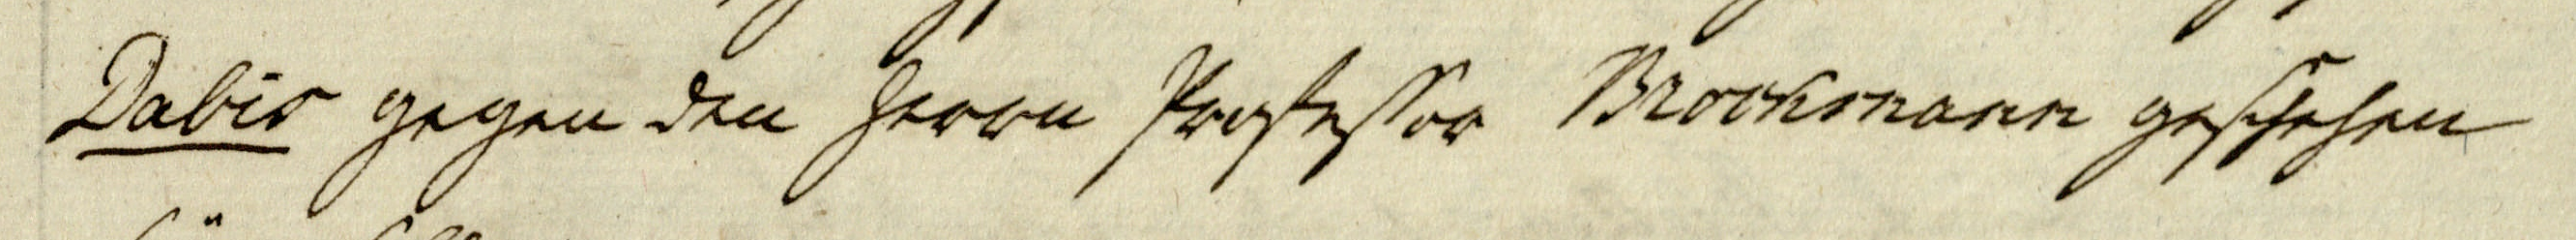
Dabis gegen den Herrn Professor Brockmann geschehen
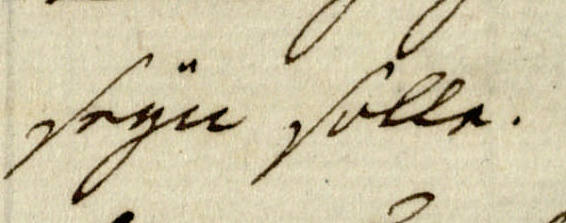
seÿn solle.
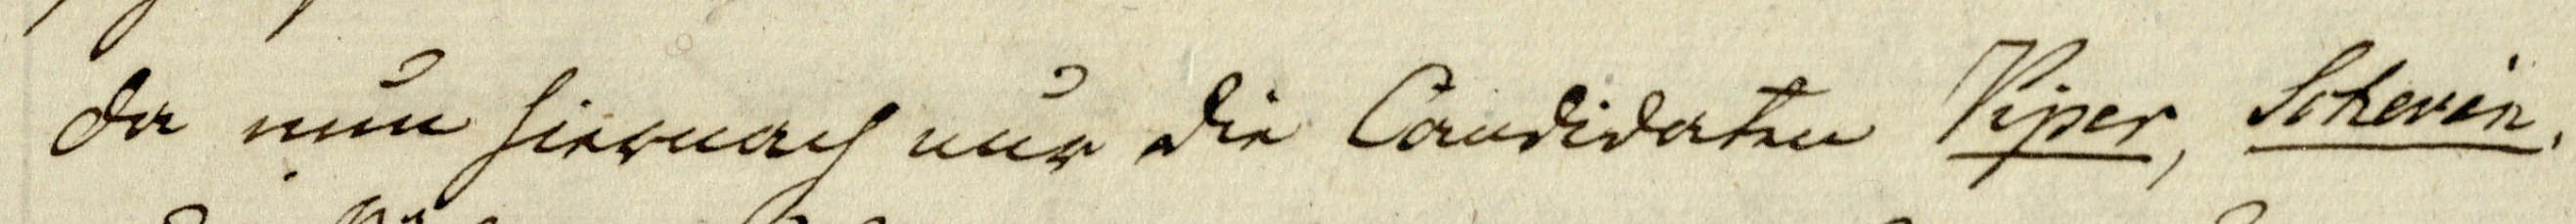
Da nun hiernach nur die Candidaten Piper, Scheven
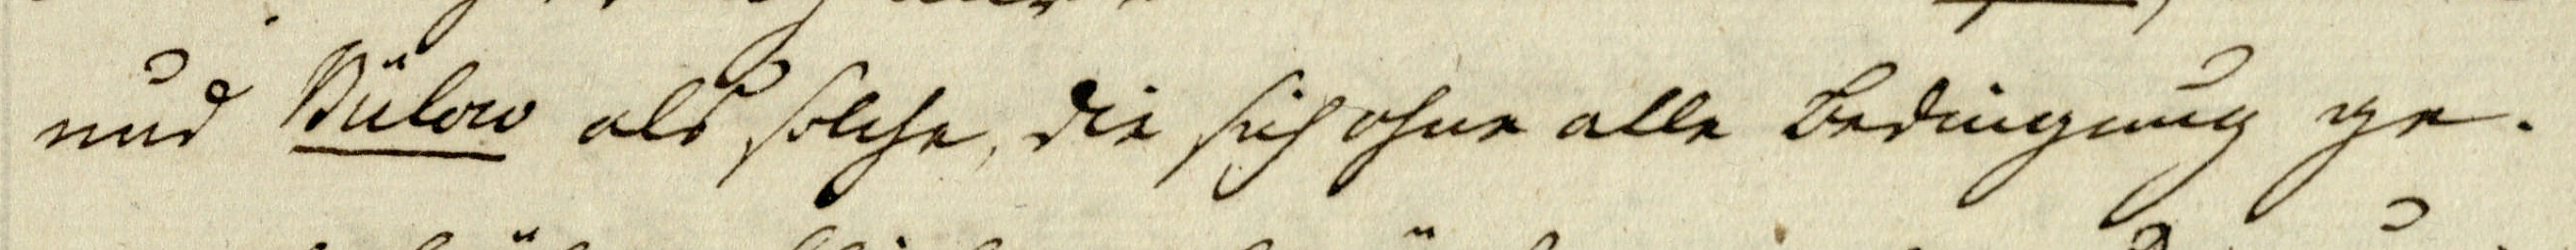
und Bülow als solche die sich ohne alle Bedingung ge¬
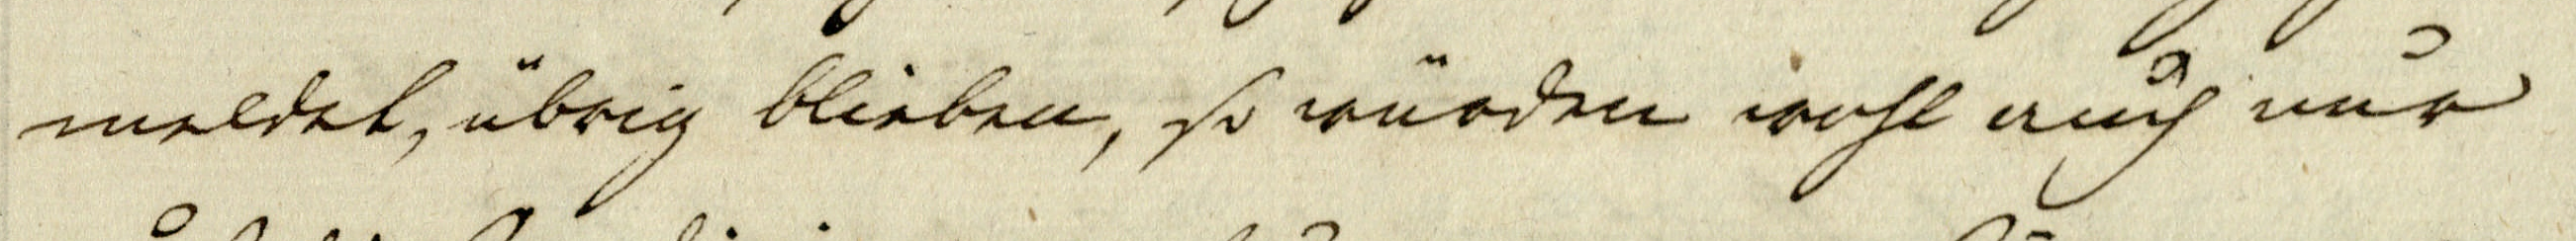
meldet, übrig blieben, so würden wohl auch nur
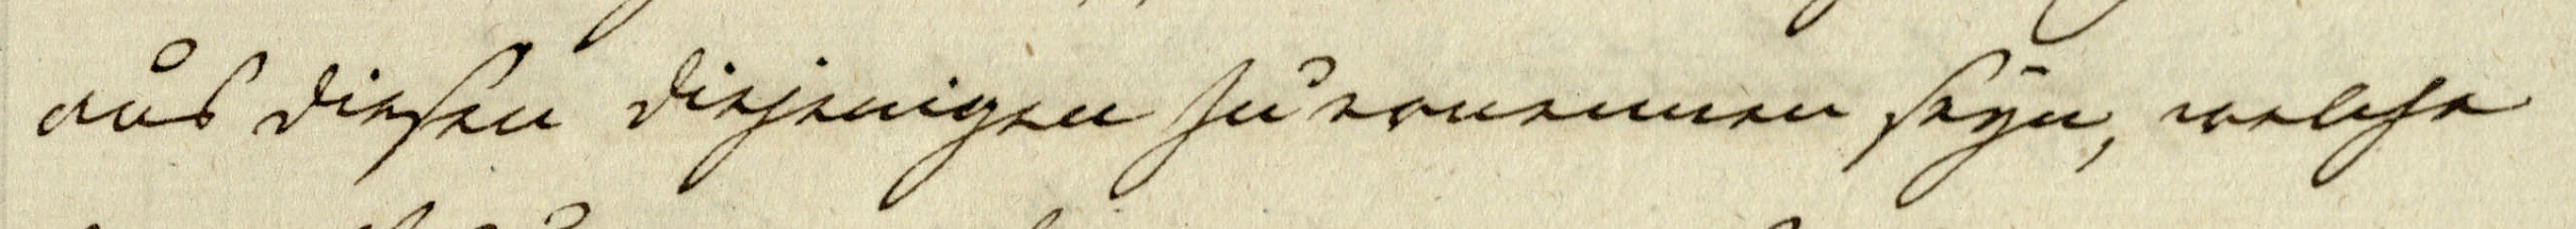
aus diesen diejenigen zu ernennen seÿn, welche
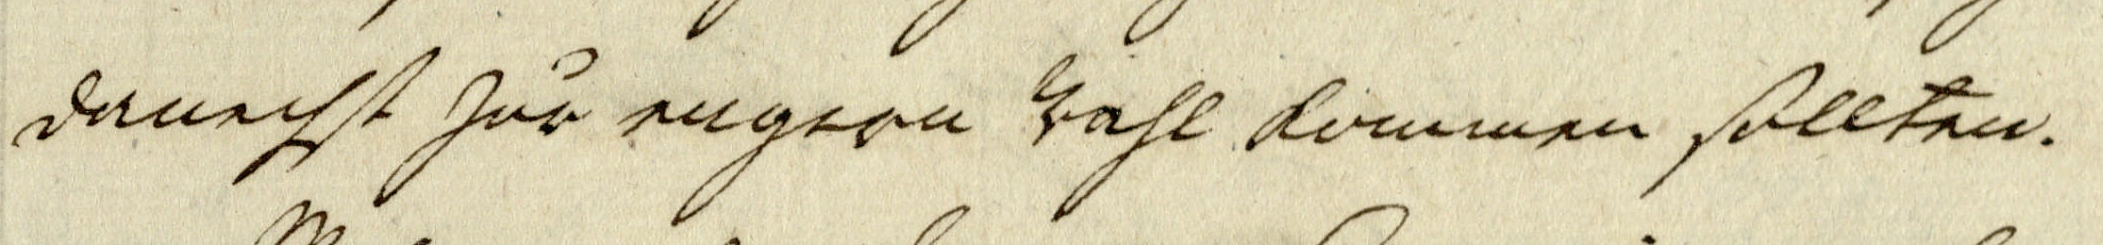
danechst zur engern Wahl kommen sollten.
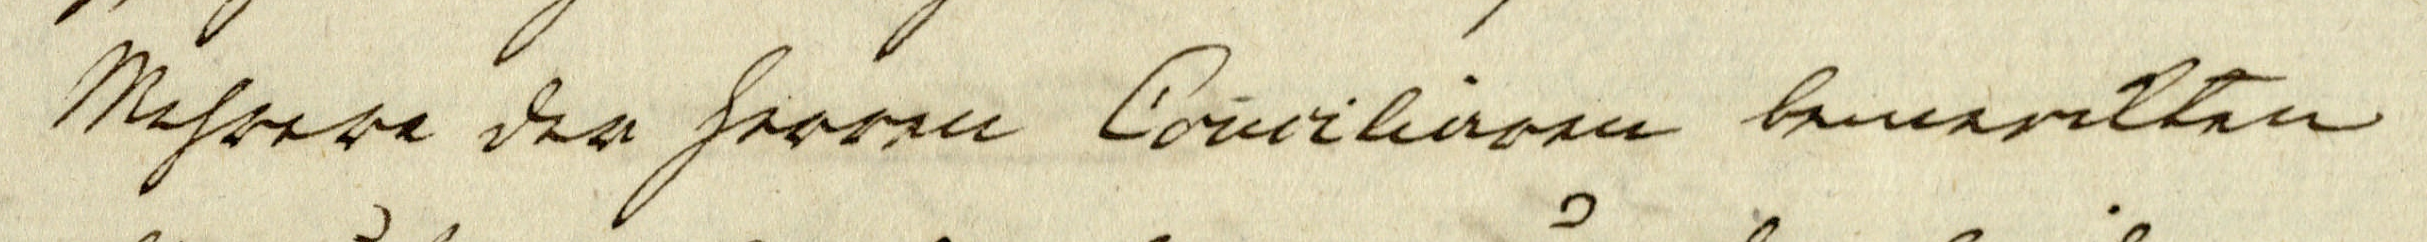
Mehrere der Herren Conciliaren bemerckten
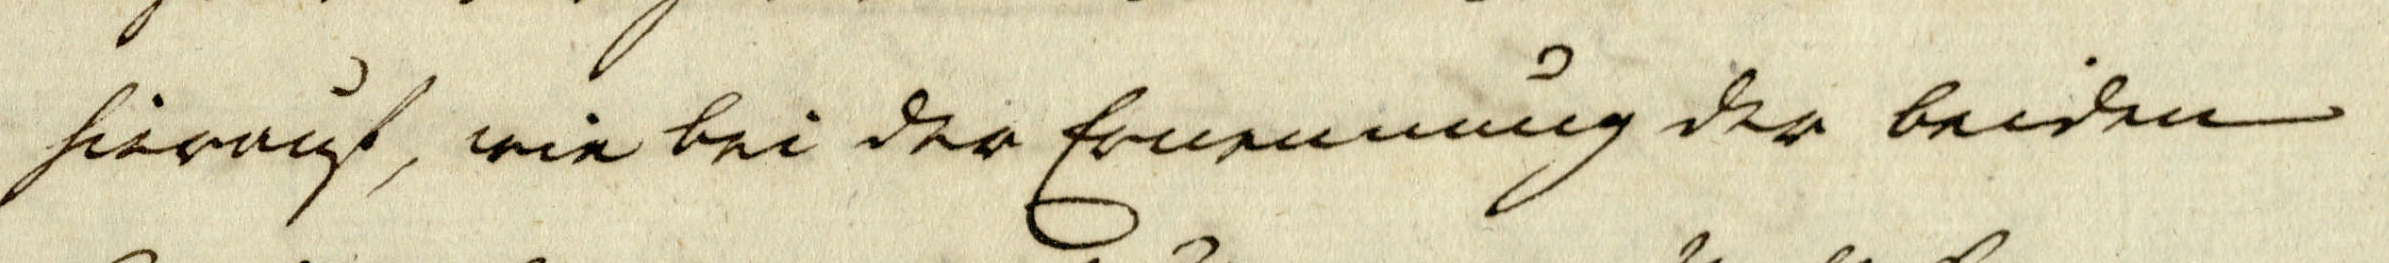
hierauf, wie bei der Ernennung der beiden
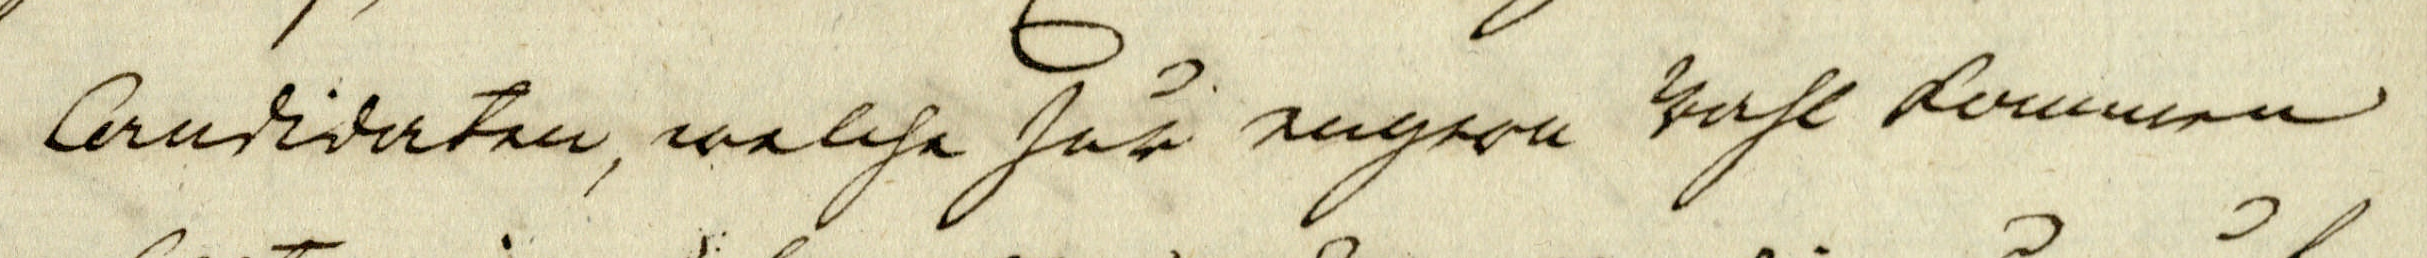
Candidaten, welche zur engern Wahl kommen
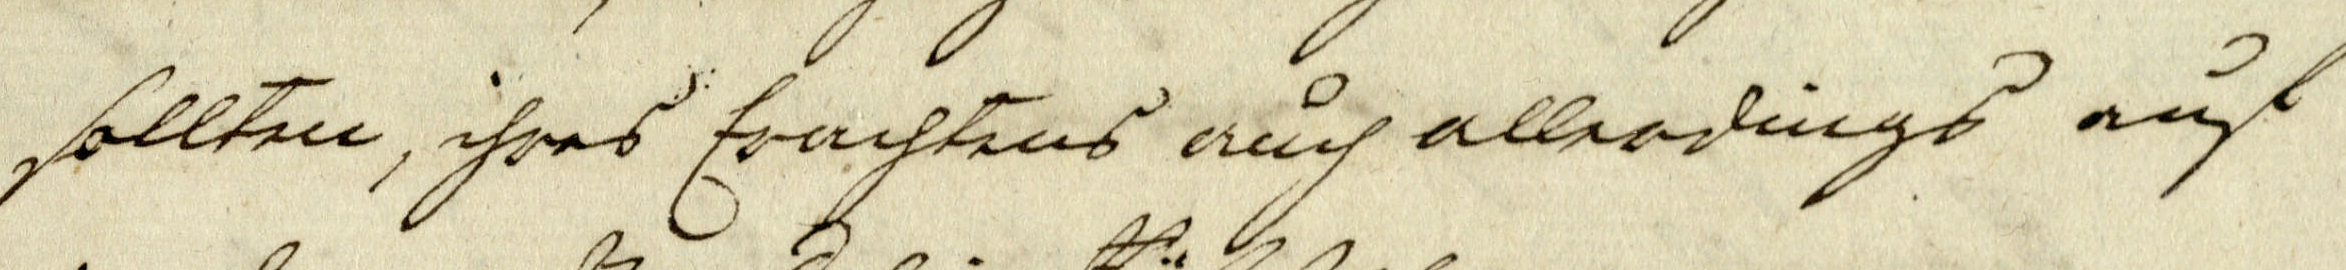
sollten, ihres Erachtens auch allerdings auf
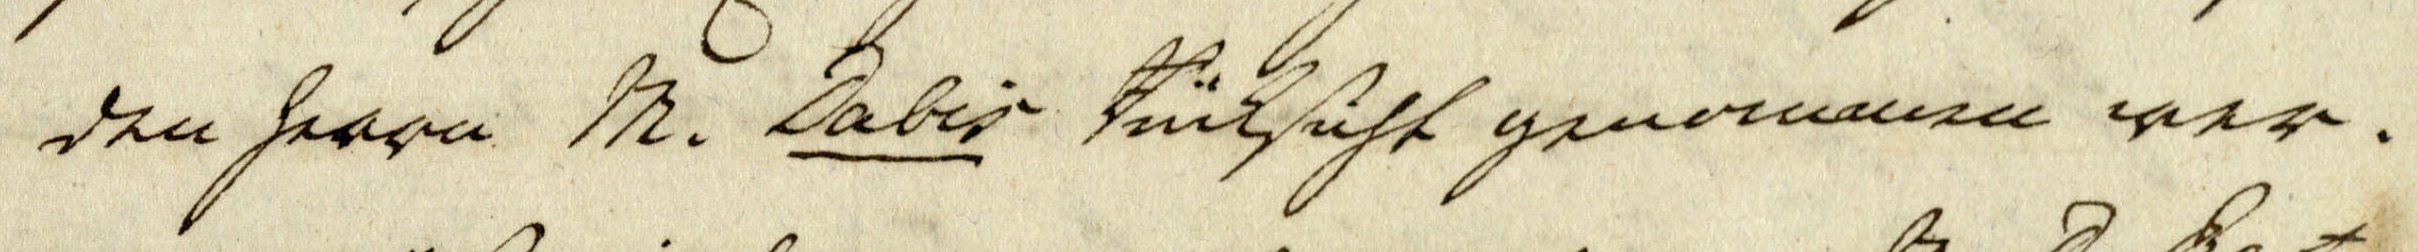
den Herrn M. Dabis Rücksicht genommen wer¬
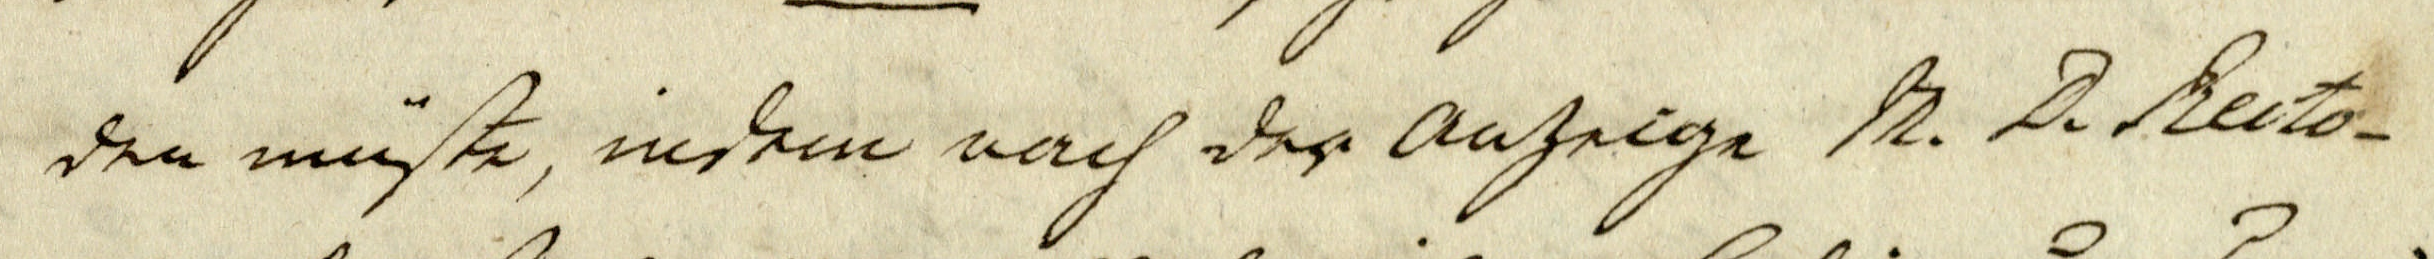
den müßte, indem nach der Anzeige M. D. Recto¬
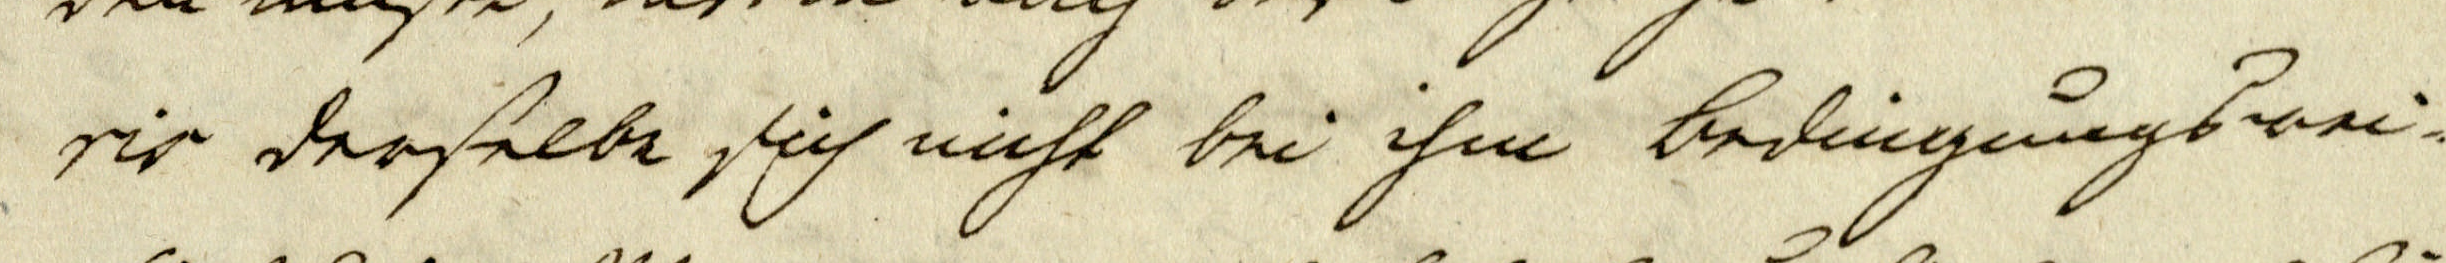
ris derselbe sich nicht bei ihm Bedingungswei¬
